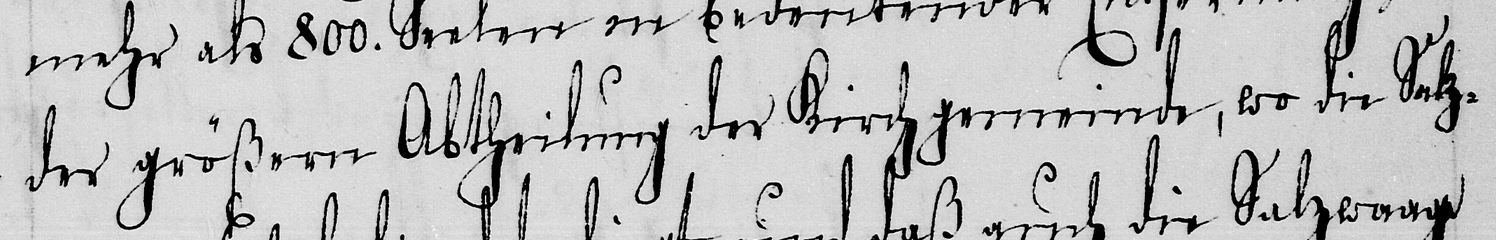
der größern Abtheilung der Kirchgemeinde, wo die Salz¬
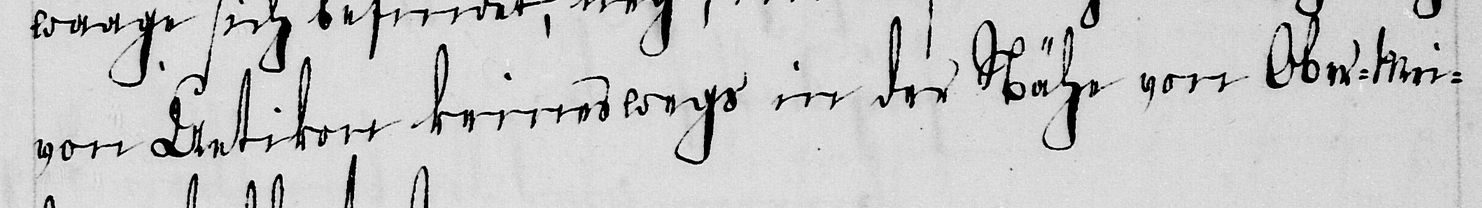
von Uetikon keineswegs in der Nähe von Ober-Mei¬
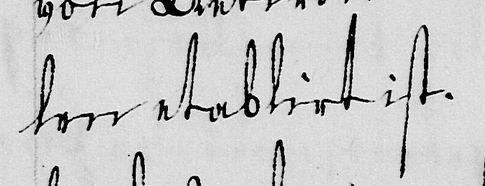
len etablirt ist.
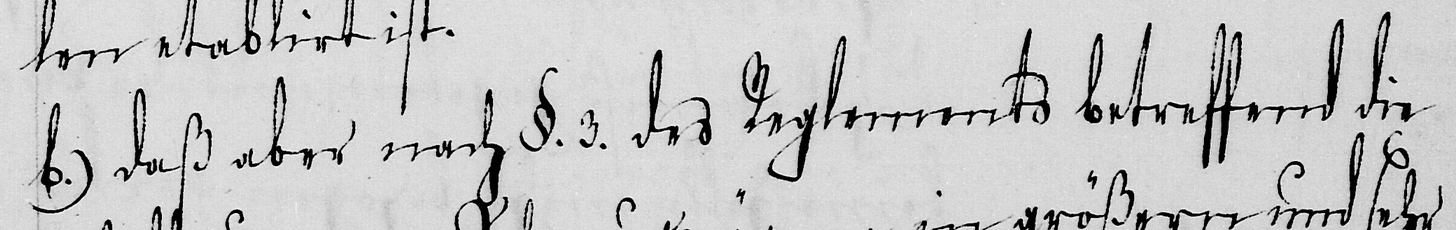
b.) daß aber nach §. 3. des Reglements betreffend die
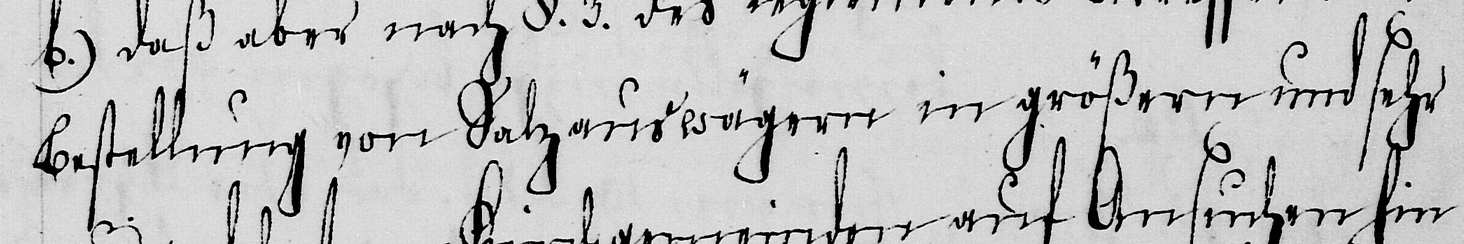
Bestellung von Salzauswägern in größern und sehr
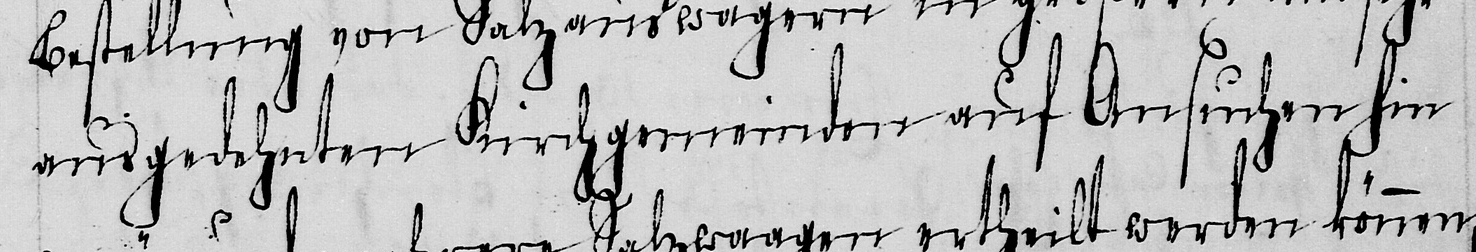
ausgedehnten Kirchgemeinden auf Ansuchen hin
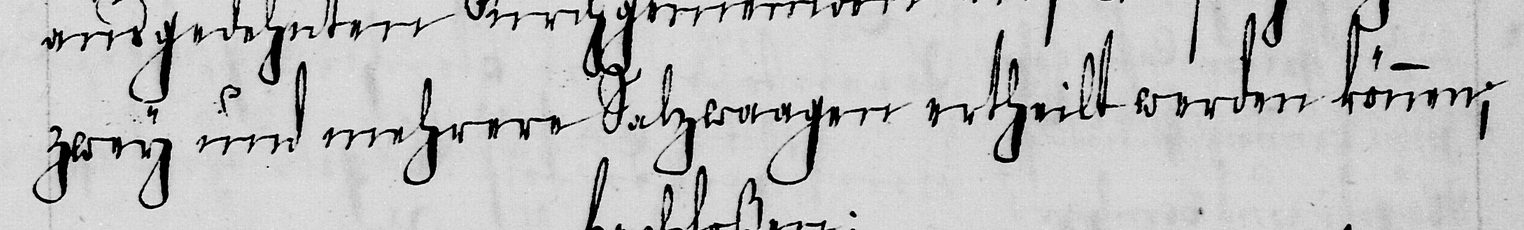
zwey und mehrere Salzwaagen ertheilt werden können;
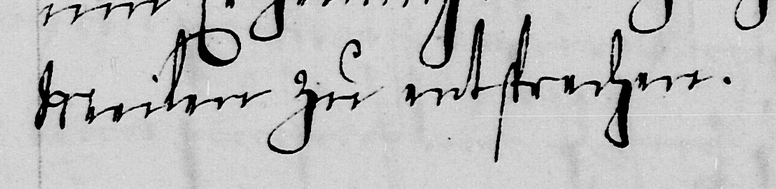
eilen zu entsprechen.
